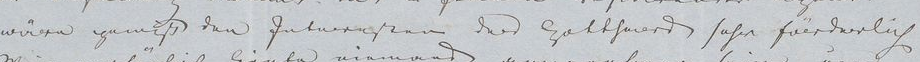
wäre gewiß den Intereßen des Gotthards sehr förderlich
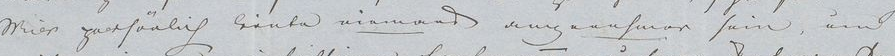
Mir persönlich könte niemand angenehmer sein, um
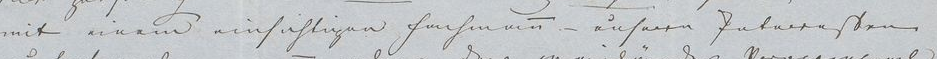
mit einem einsichtigen Fachmann, unsere Interessen
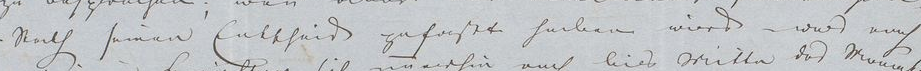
Rath seinen Entscheid gefaßt haben wird, was nach
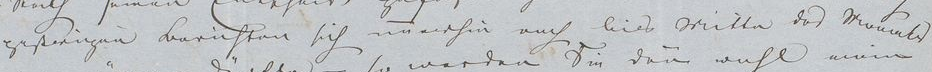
getrigen Berichten sich immerhin noch bis Mitte des Monats
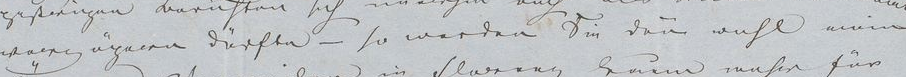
verzögern dürfte, so werden Sie dann wohl mein
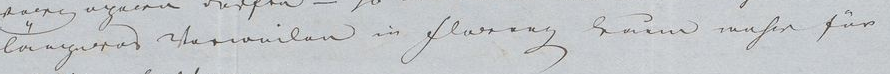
längeres Verweilen in Florenz kaum mehr für
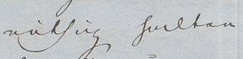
nöthig halten.
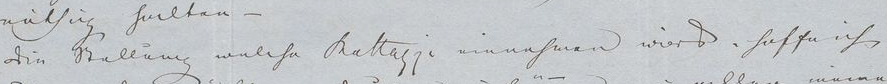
Die Stellung welche Rattazzi einnehmen wird, hoffe ich
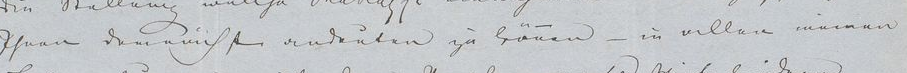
Ihnen demnächst andeuten zu können, in allen meinen
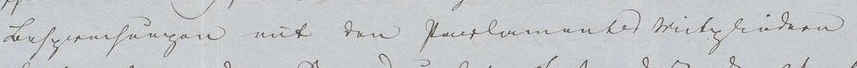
Besprechungen mit den Parlaments Mitgliedern
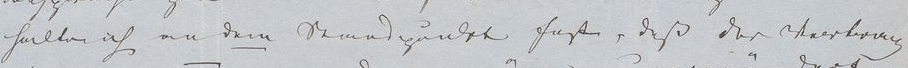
halte ich an dem Standpunkt fest, daß der Vertrag
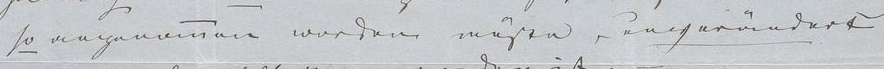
so angenommen werden müße, unverändert
